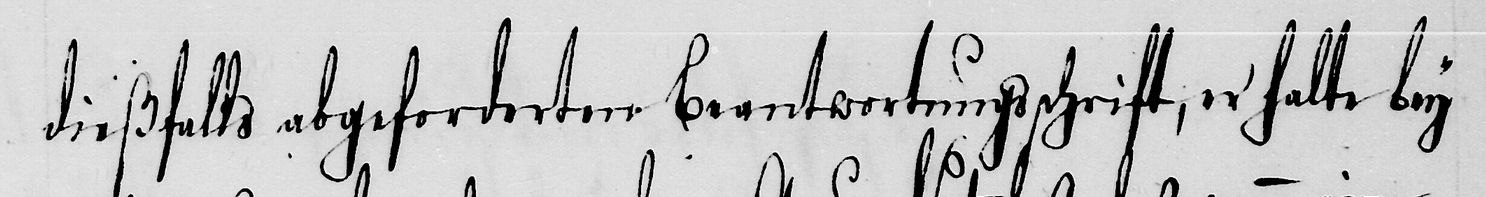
dießfalls abgeforderten Beantwortungsschrift, er halte
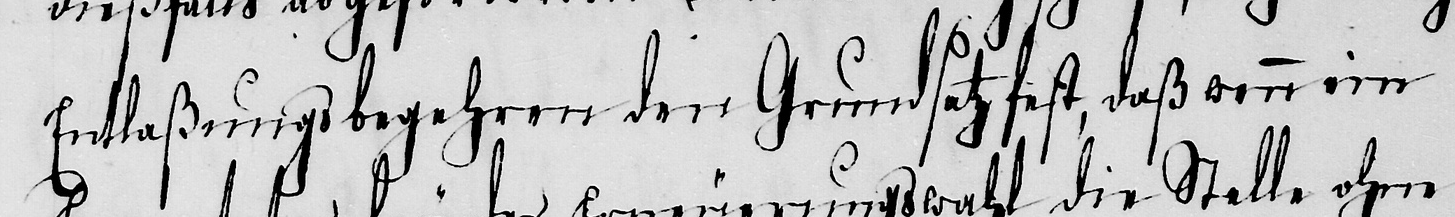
Entlaßungsbegehren den Grundsatz fest, daß wenn ein
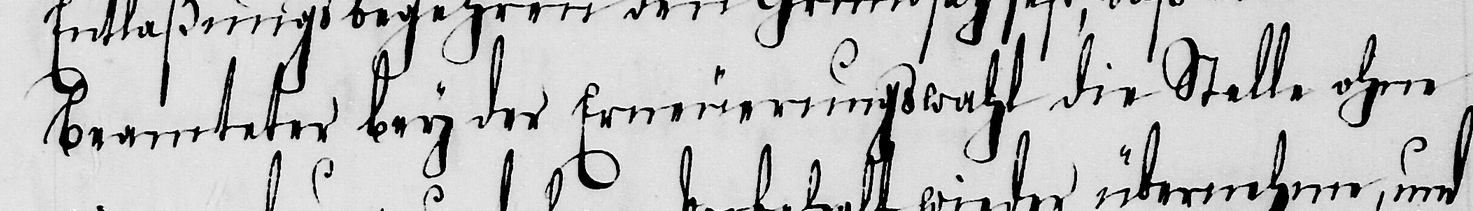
Beamteter bey der Erneuerungswahl die Stelle ohne
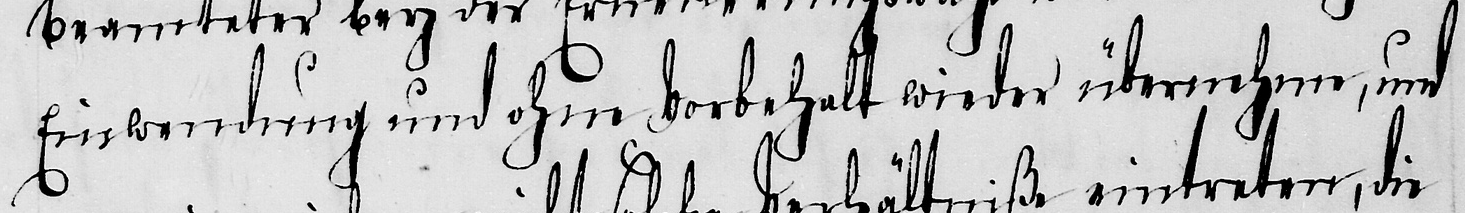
Einwendung und ohne Vorbehalt wieder übernehme, und
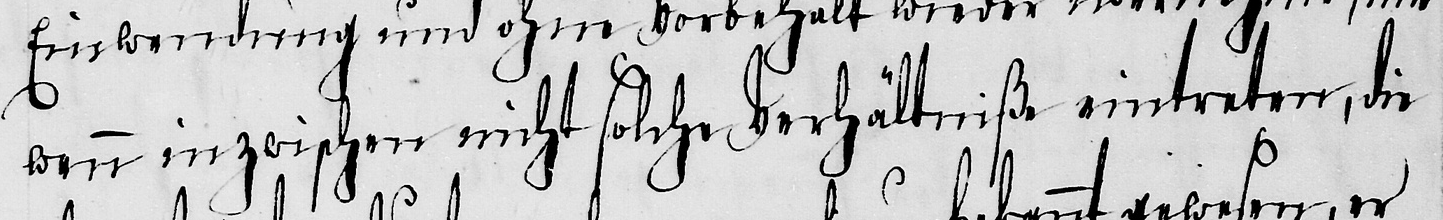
wenn inzwischen nicht solche Verhältniße eintreten, die
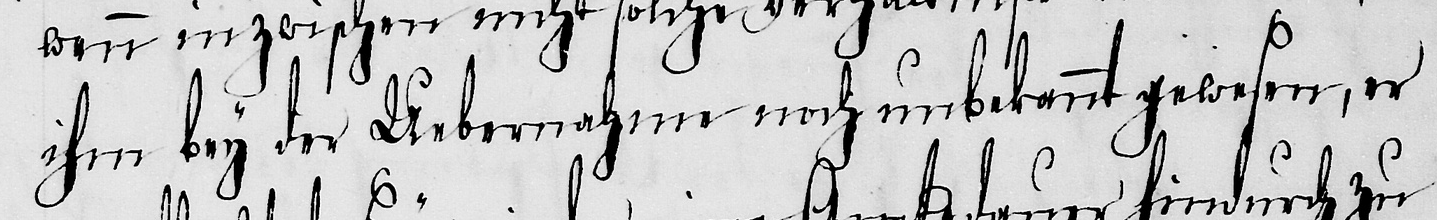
ihm bey der Uebernahme noch unbekannt gewesen, er
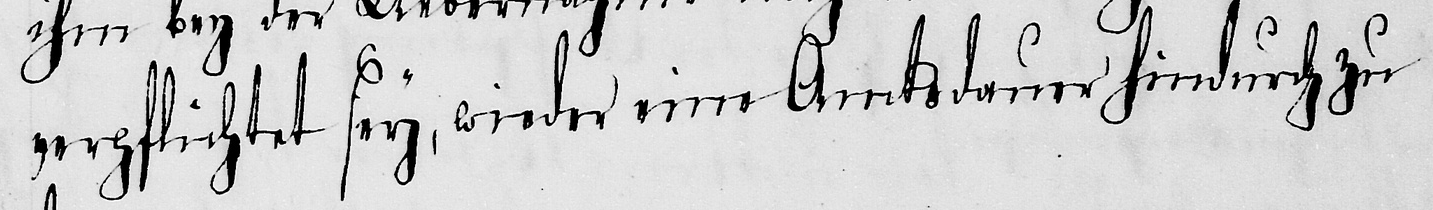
verpflichtet sey, wieder eine Amtsdauer hindurch zu
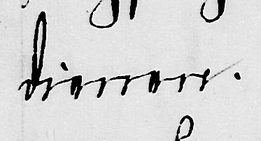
dienen.
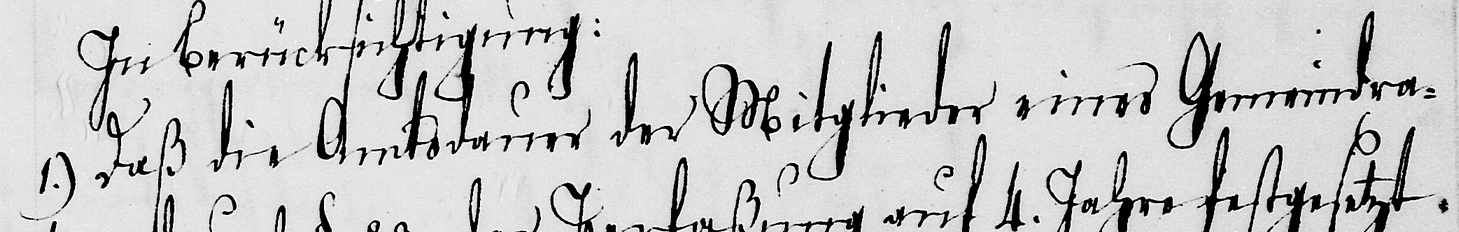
1.) Daß die Amtsdauer der Mitglieder eines Gemeindra¬
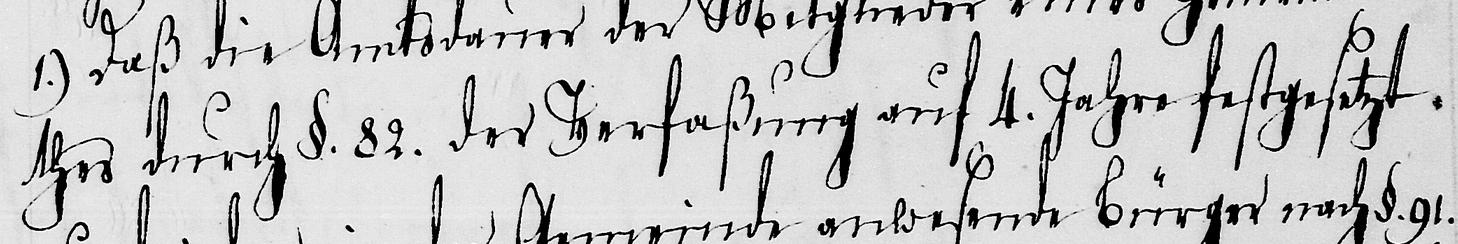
thes durch §. 82. der Verfaßung auf 4. Jahre festgesetzt
